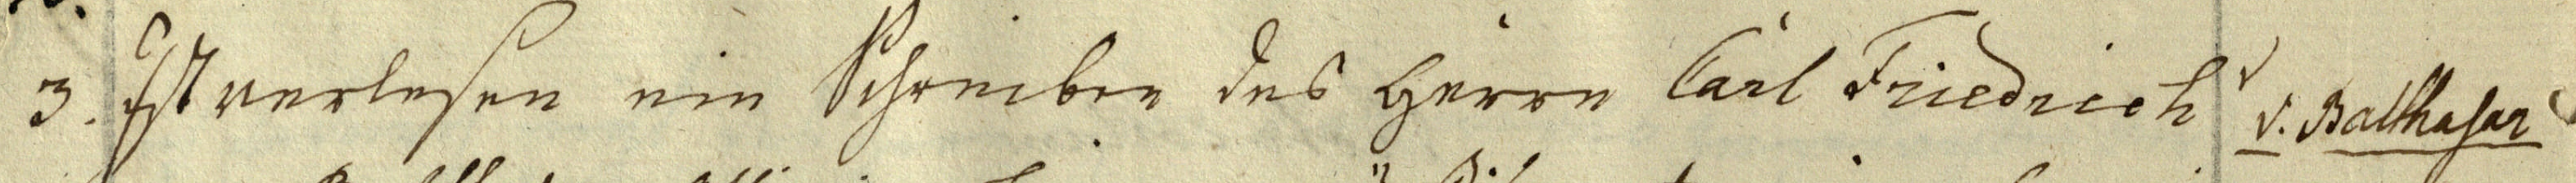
3. Ist verlesen ein Schreiben des Herrn Carl Friedrich v. Balthasar
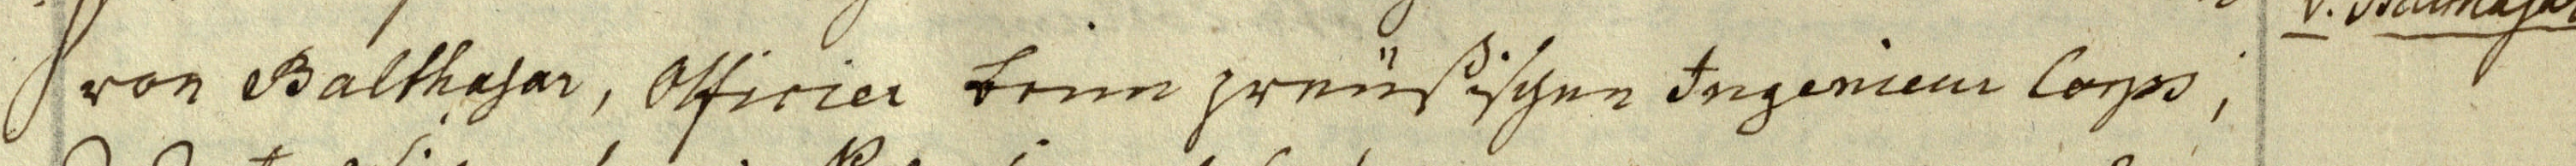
von Balthasar, Officier beim preußischen Ingenieur Corps;
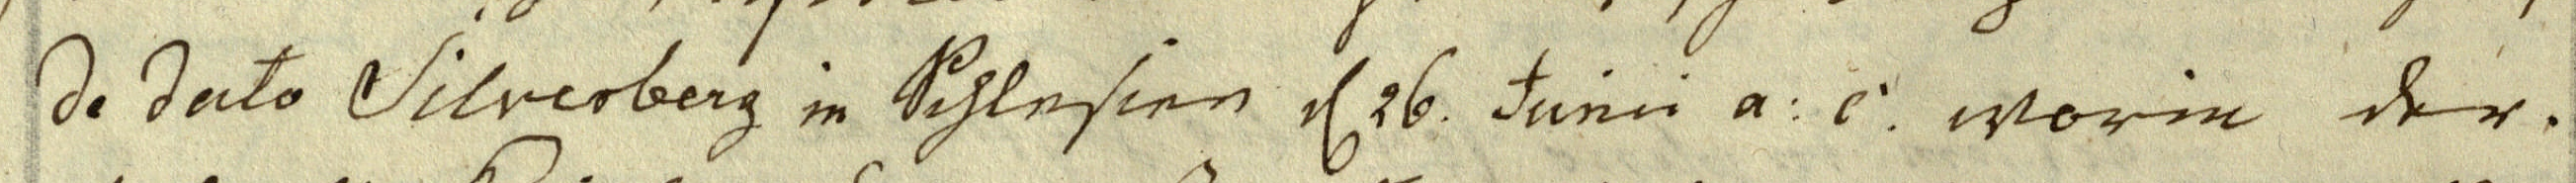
de dato Silverberg in Schlesien d 26. Junii a. c. worin der¬
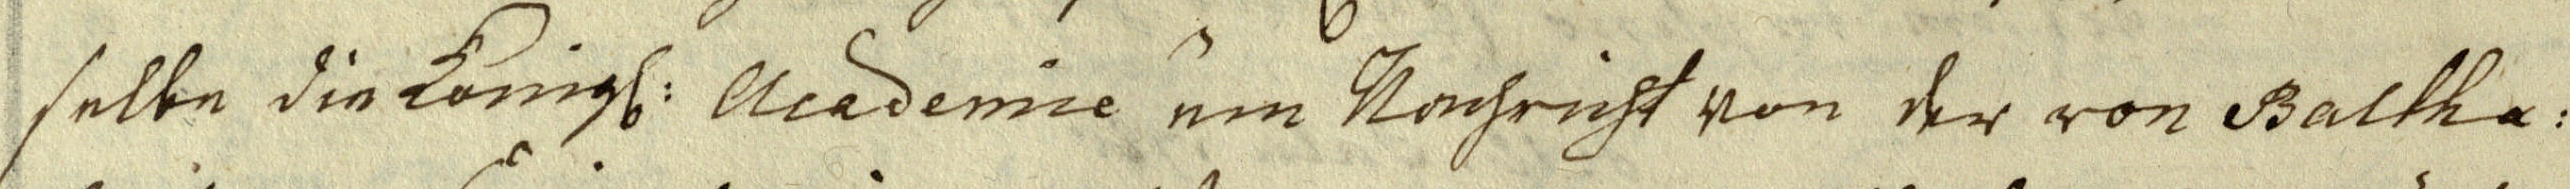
selbe die Königl. Academie um Nachricht von der Baltha¬
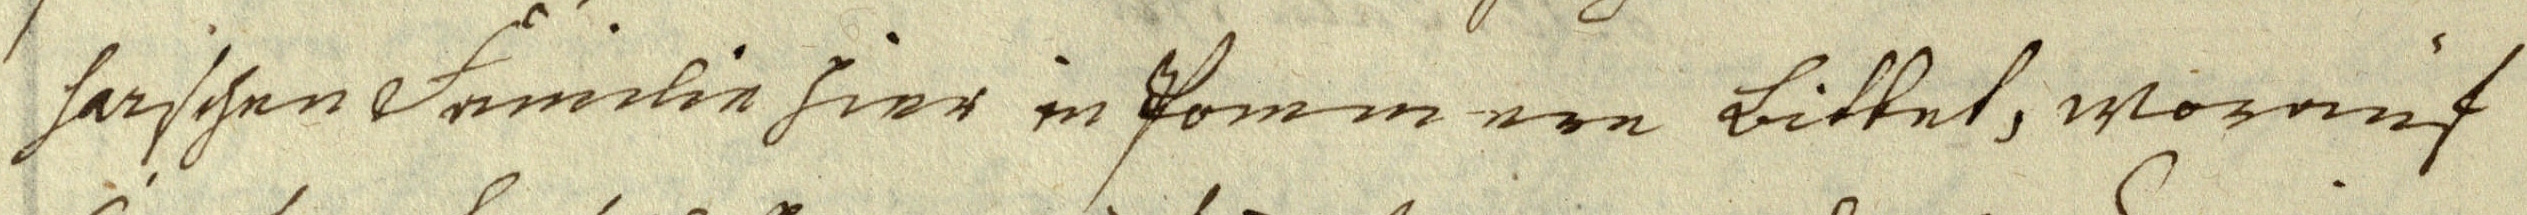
sarschen Familie hier in Pommern bittet, worauf
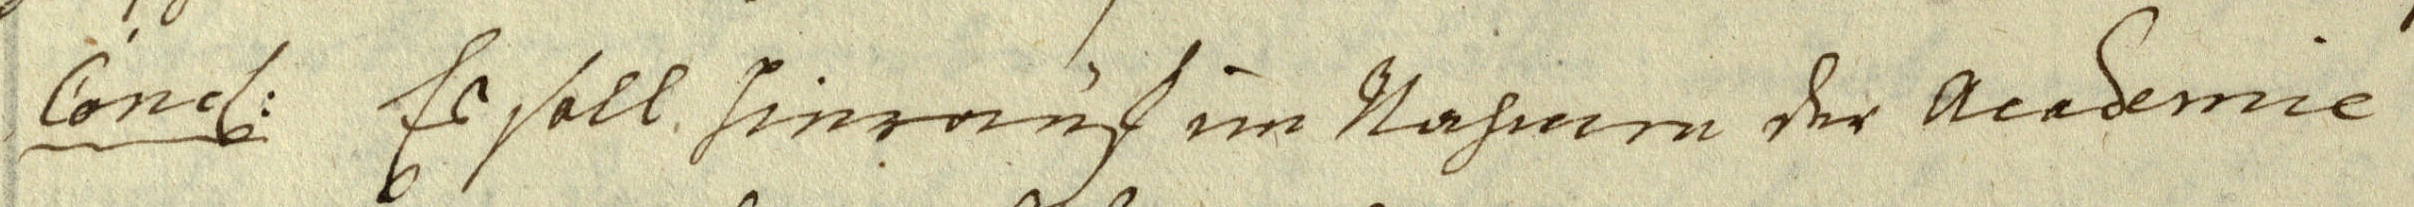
Concl: es soll hierauf im Nahmen der Academie
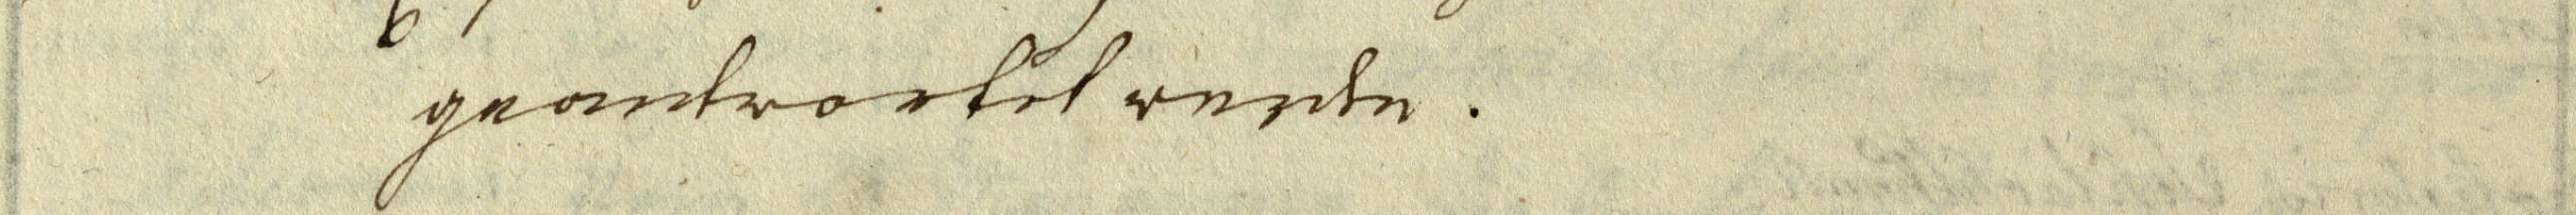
geantwortet werden.
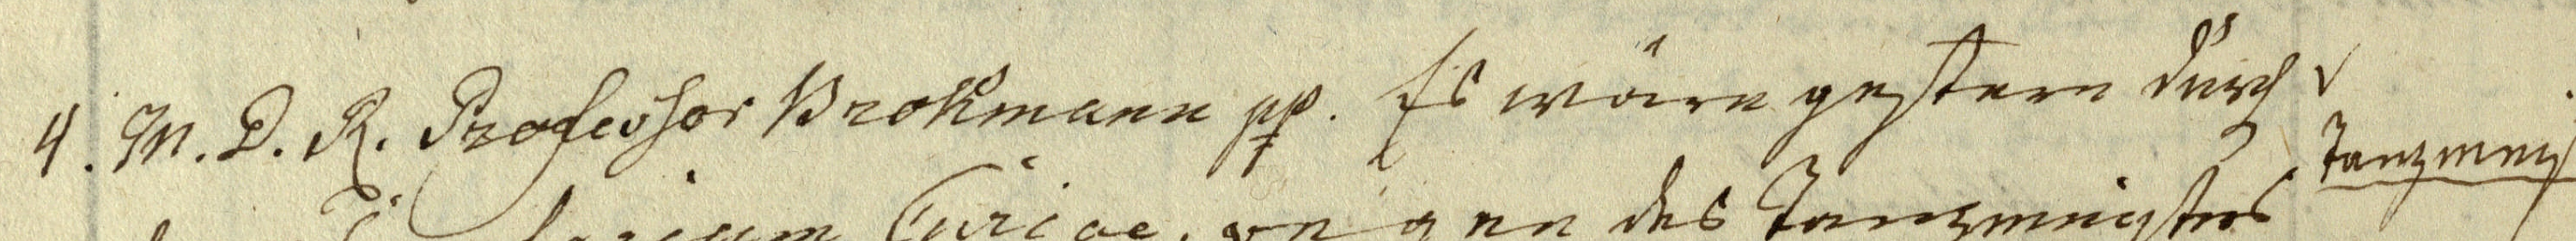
4. M. D. R. Professor Brokmann pp. Es wäre gestern durch
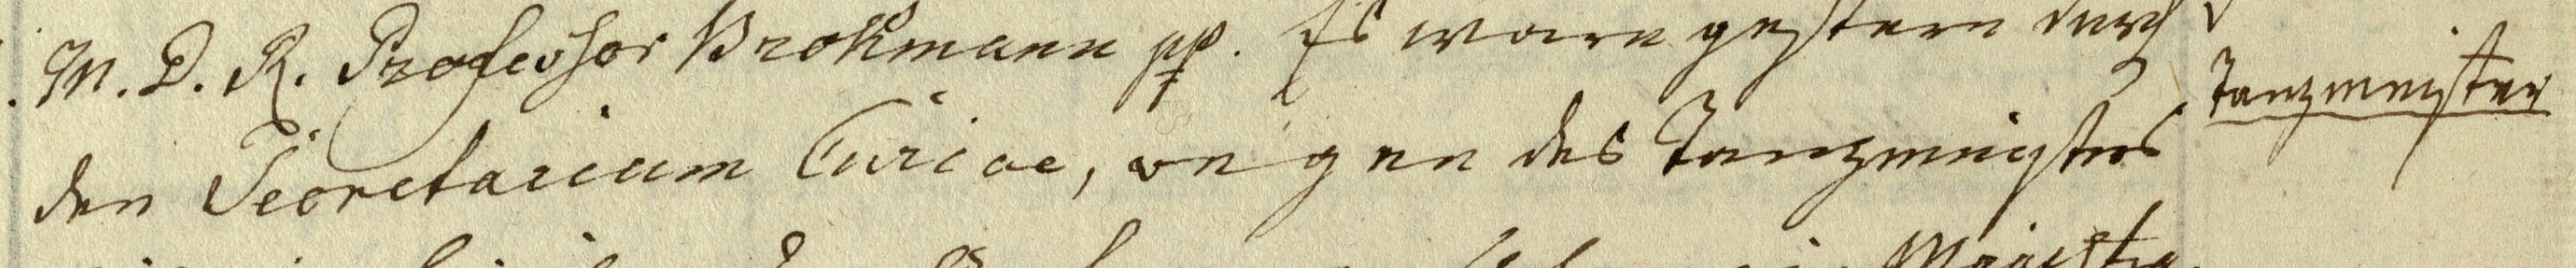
den Secretarium Curiae, wegen des Tanzmeisters Tanzmeister
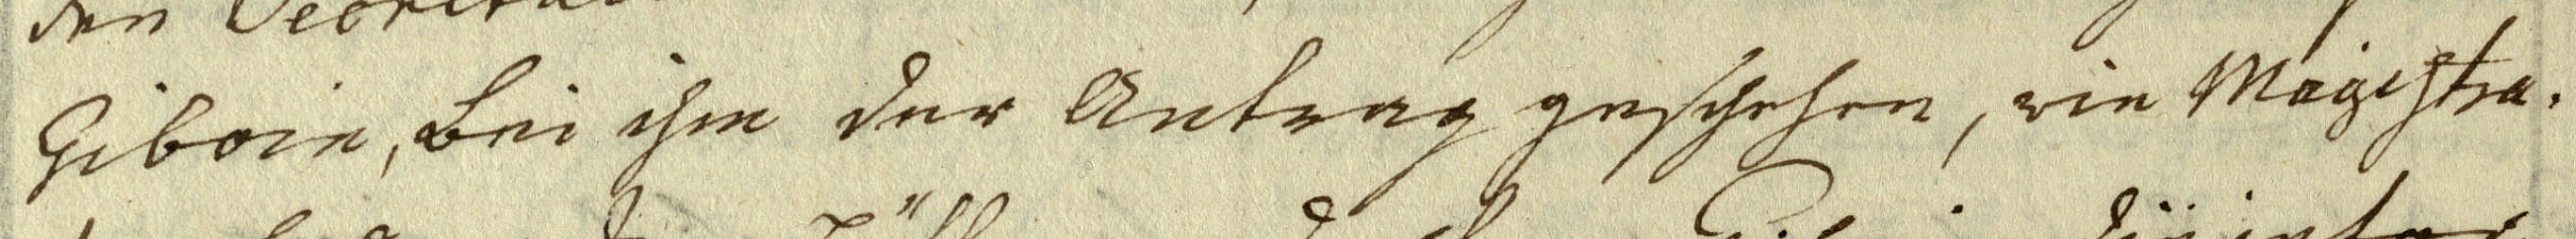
Giboin, bei ihm der Antrag geschehen, wie Magistra¬
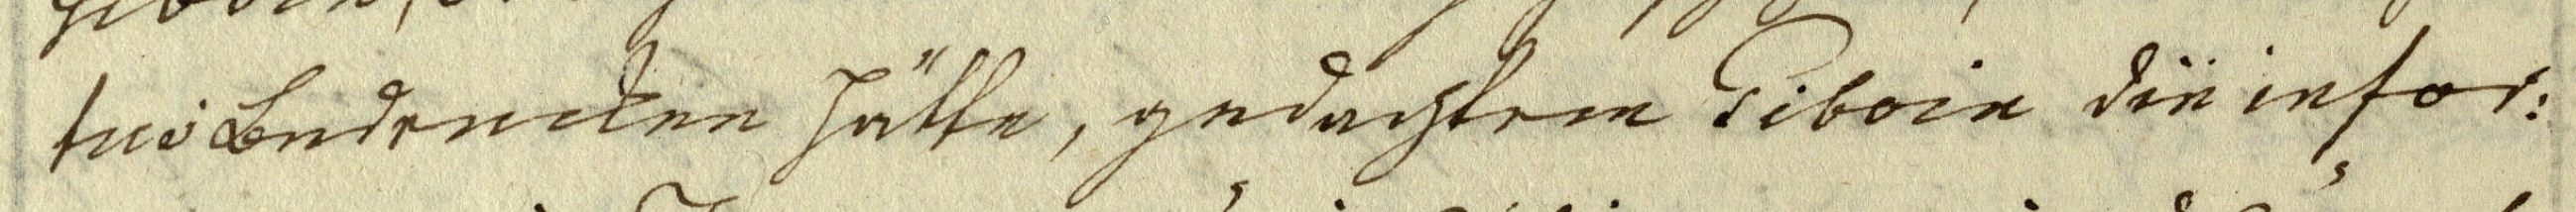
tus Bedencken hätte, gedachtem Giboin die infor¬
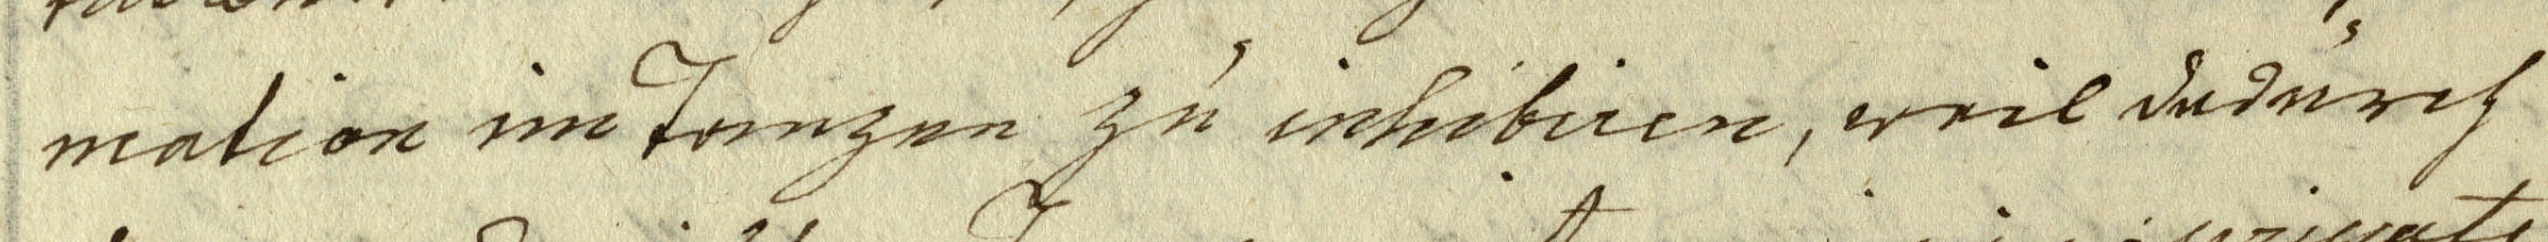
mation im Tanzen zu inhibiren, weil dadurch
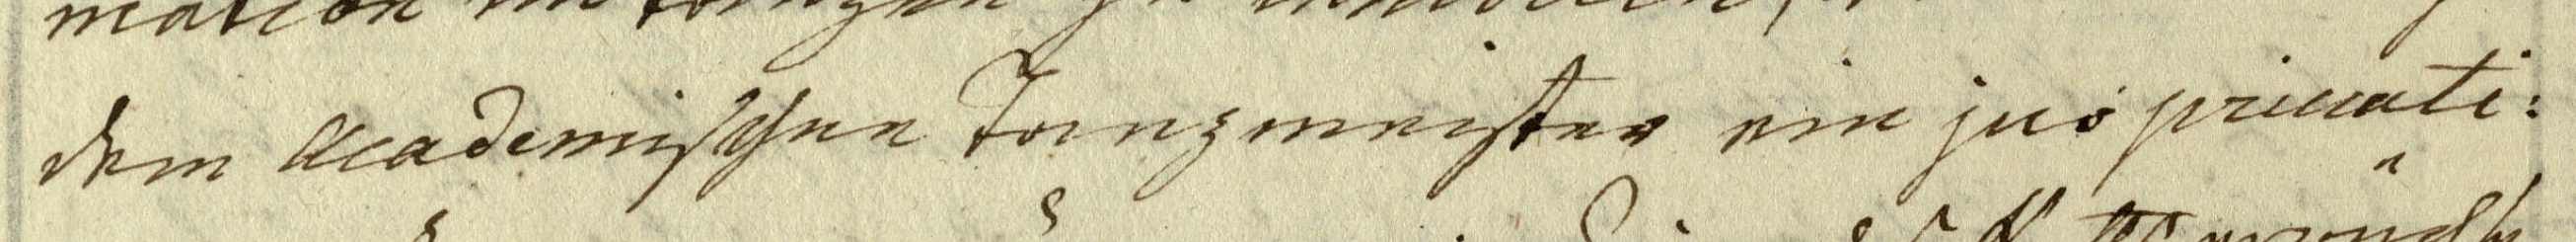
dem Academischen Tanzmeister ein jus privati¬
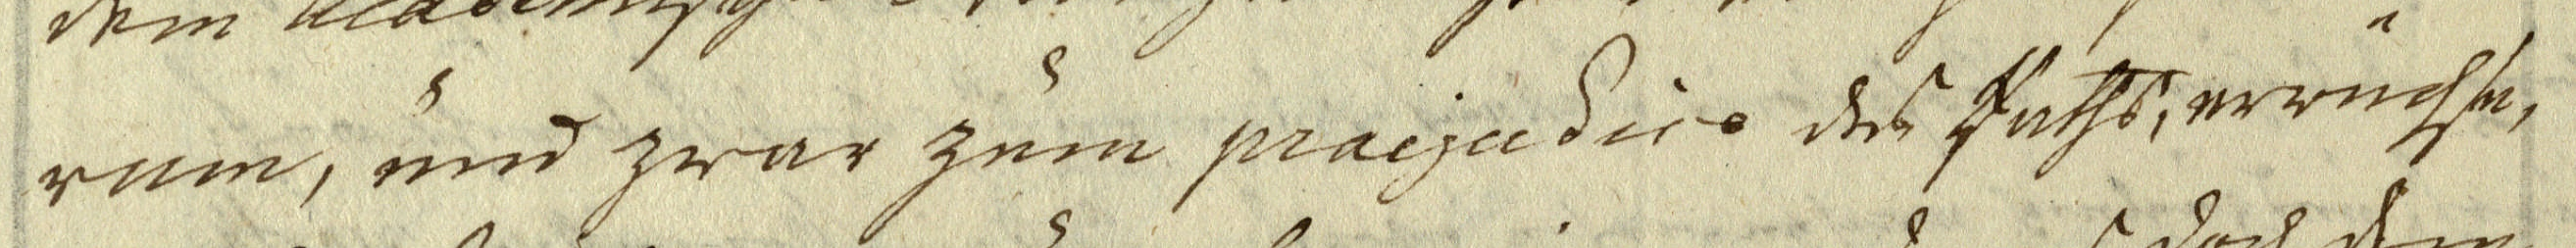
vum, und zwar zum praejudice des Raths, erwüchse,
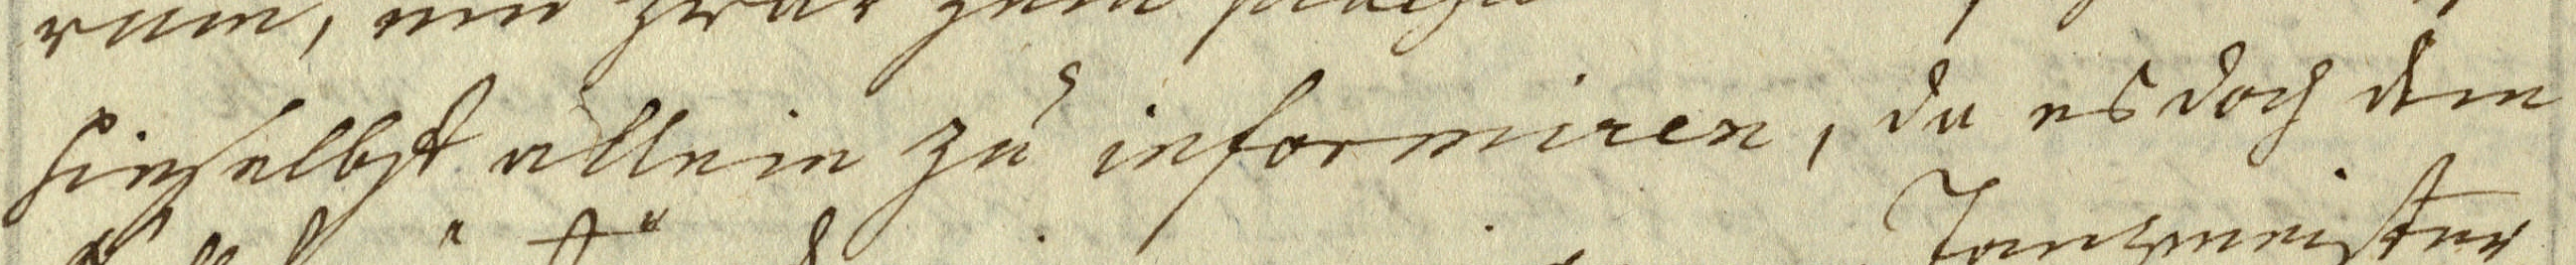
hieselbst allein zu informiren, da es doch dem
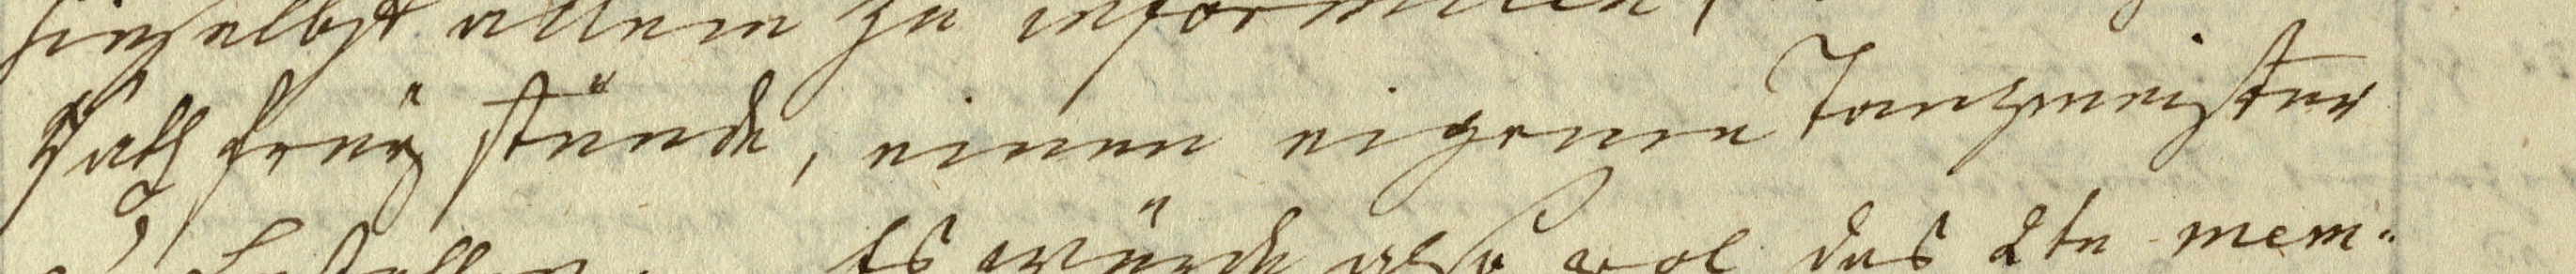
Rath freÿ stünde, einen eigenen Tanzmeister
